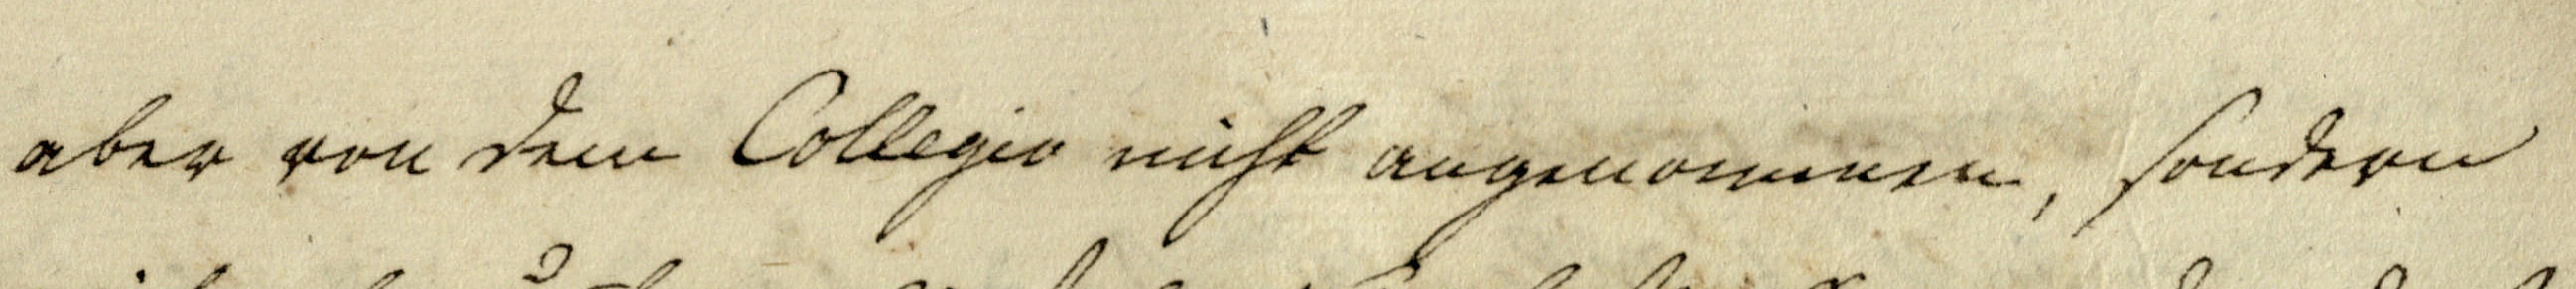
aber von dem Collegio nicht angenommen, sondern
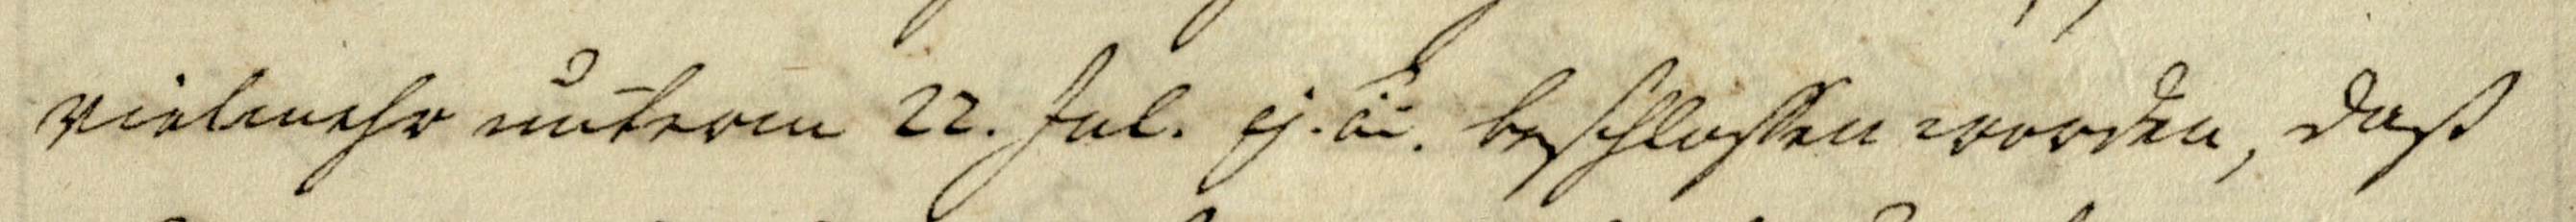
vielmehr unterm 22. Jul. ej. ac. beschlossen worden, daß
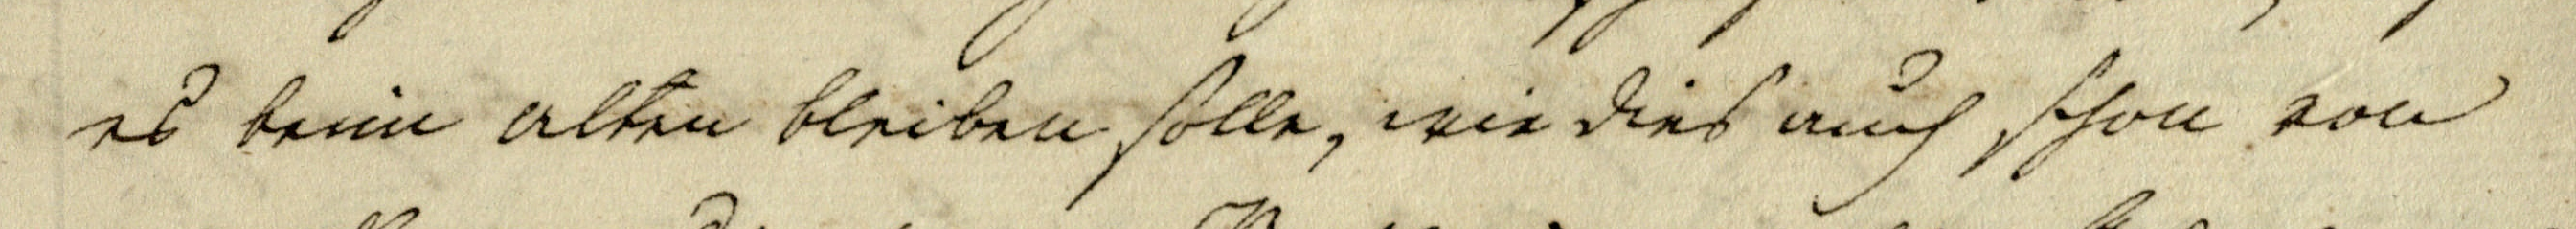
es bei alten bleiben solle, wie dies auch schon von
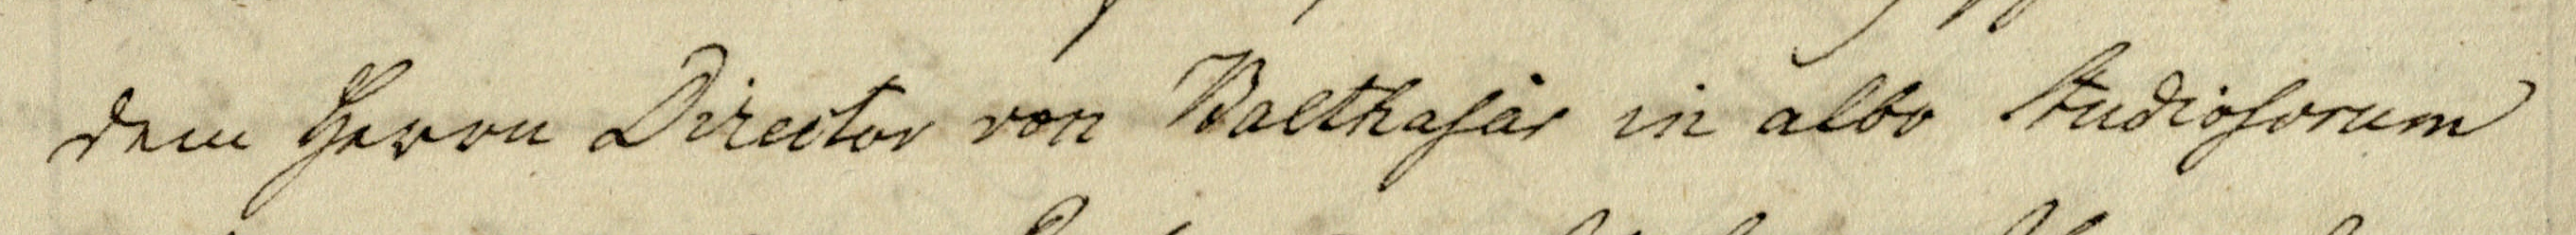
dem Herrn Director von Balthasar in albo Studiosorum
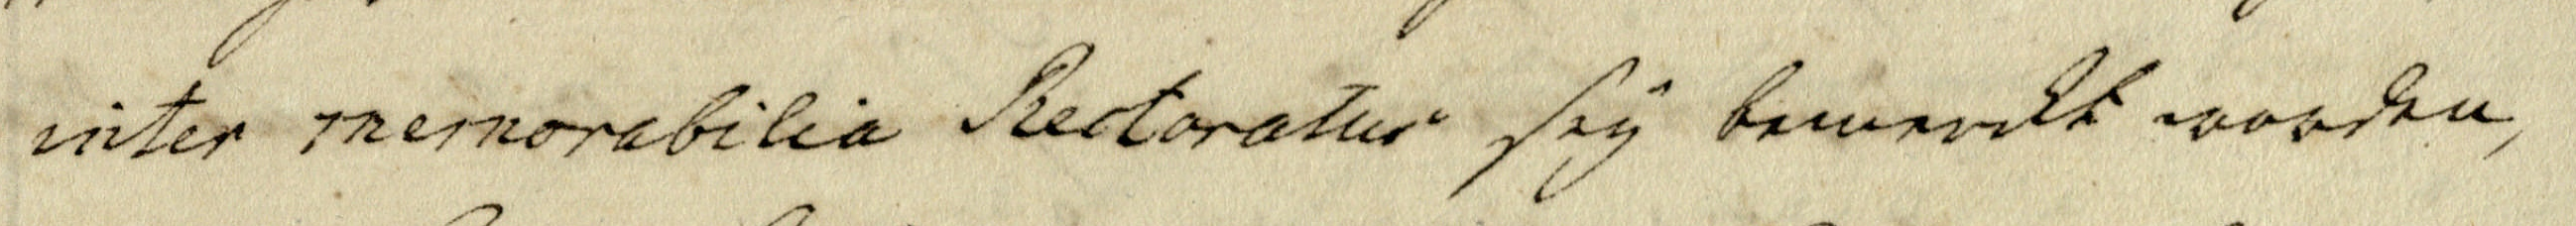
unter memorabilia Rectoratus seÿ bemerckt worden,
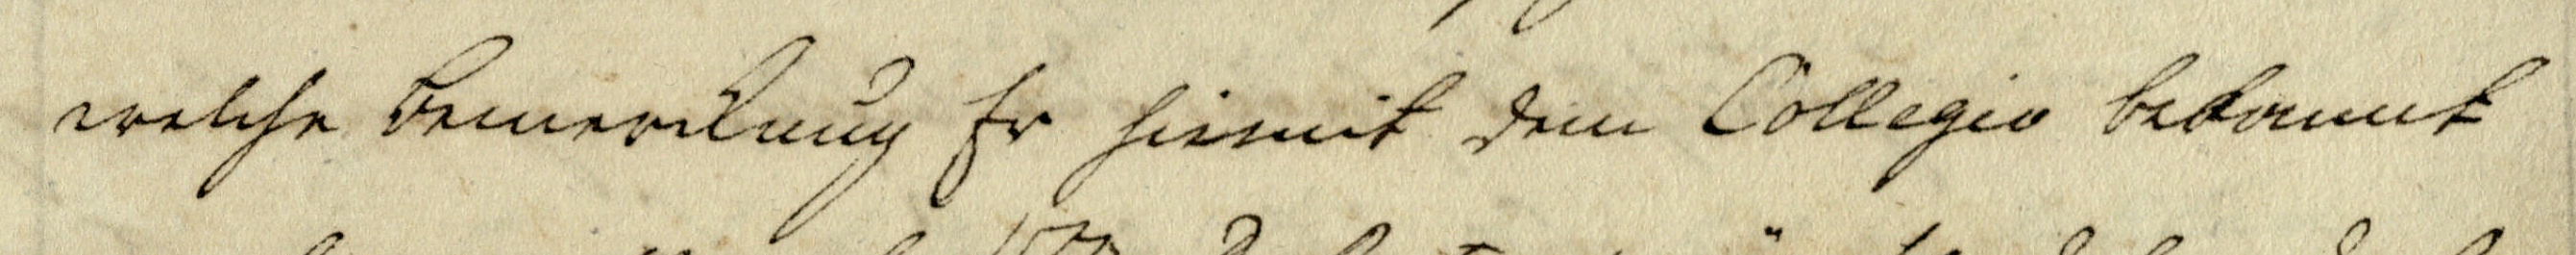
welche Bemerckung Er hiemit dem Collegio bekannt
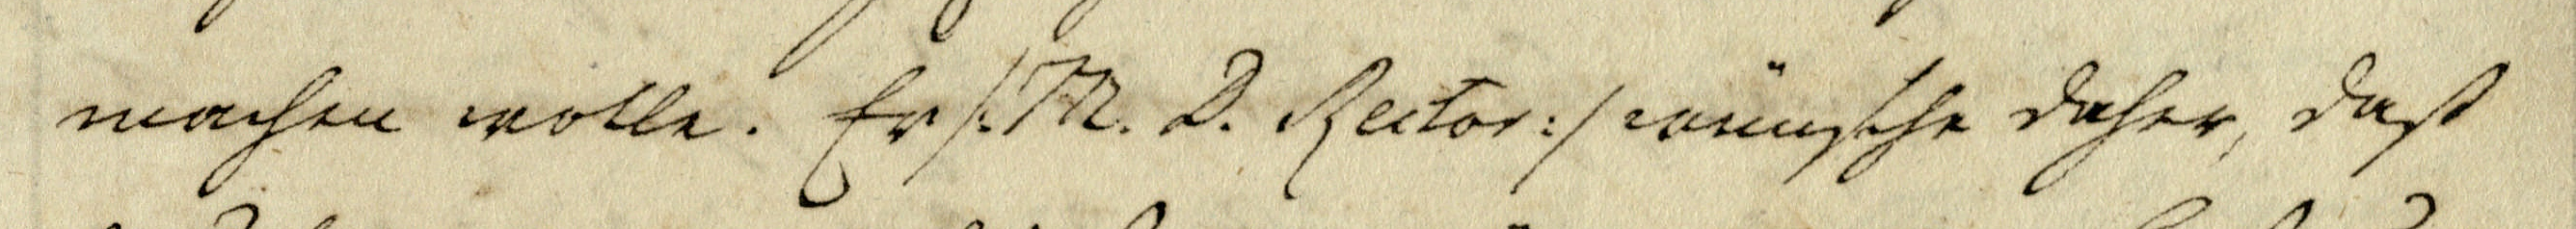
machen wolle. Er /: M. D. Rector :/ wünsche daher, daß
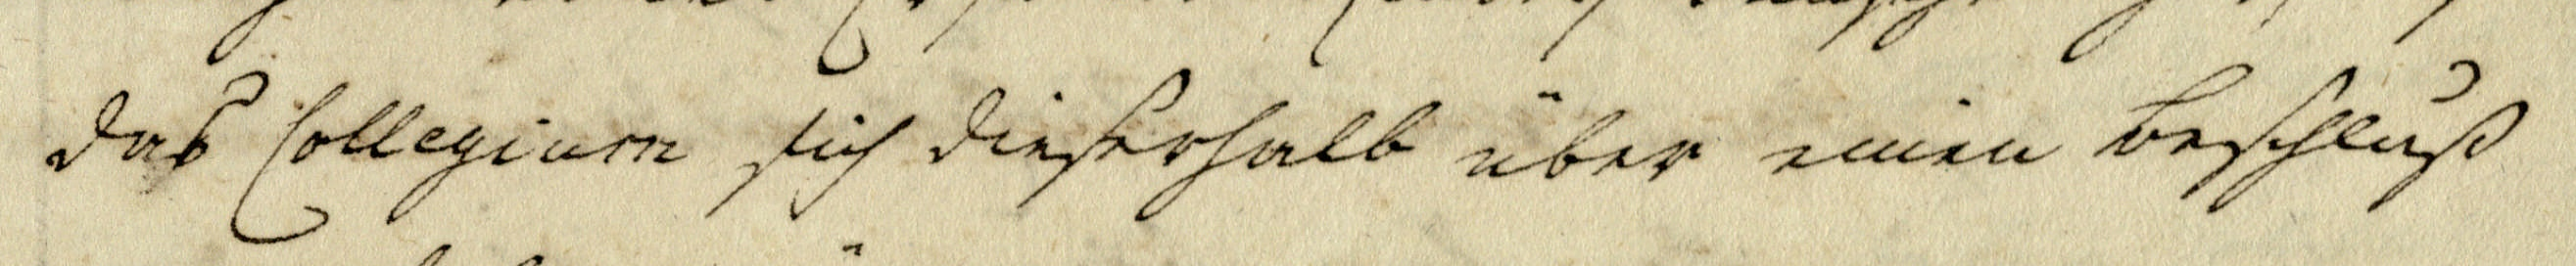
das Collegium sich dieserhalb über einen Beschluß
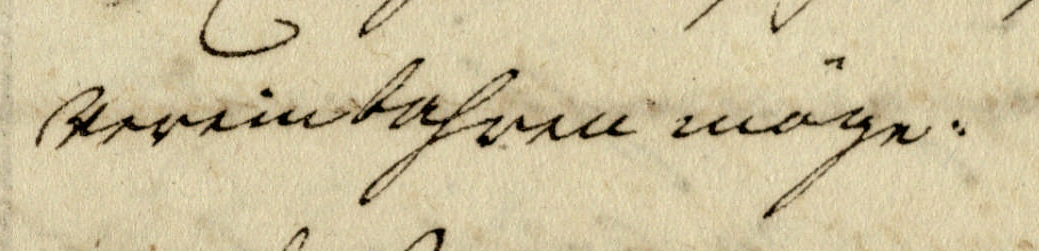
vereinbahren möge:
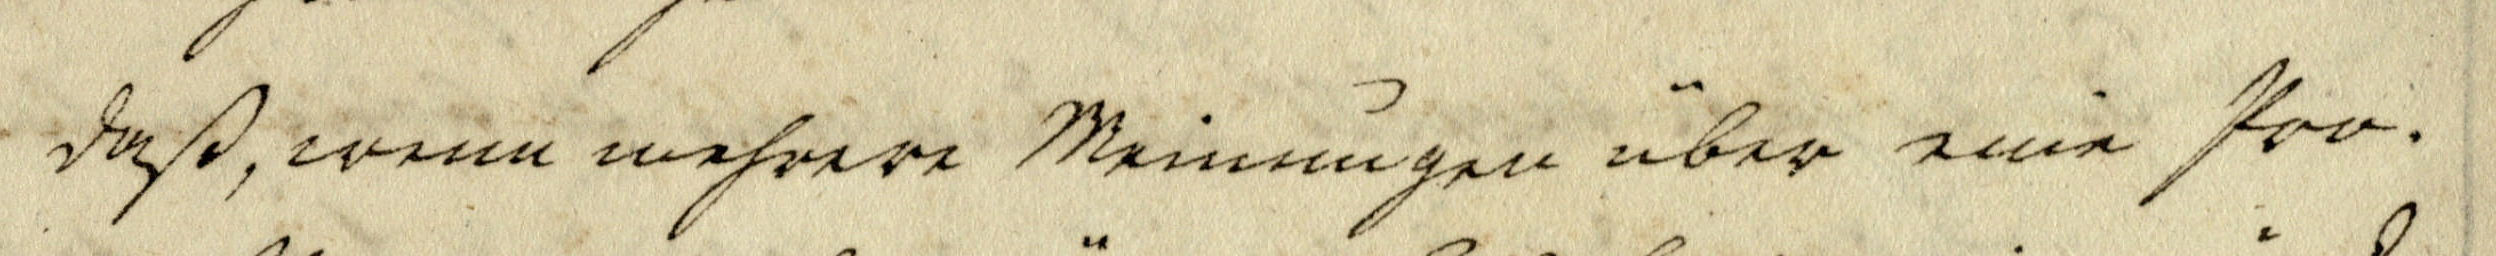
daß, wenn mehrere Meinungen über eine Pro¬
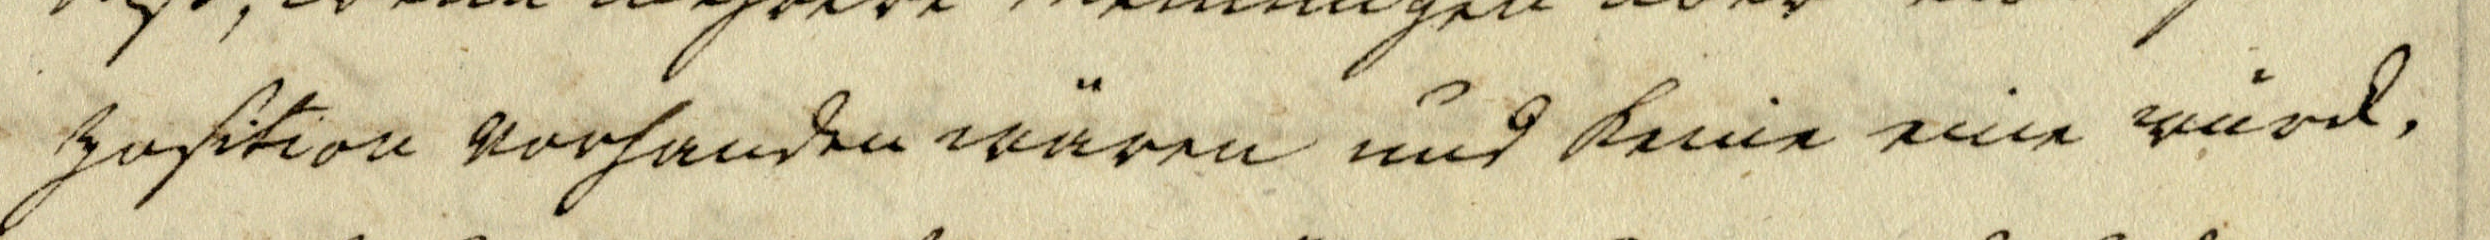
position vorhanden wären und keine eine würck¬
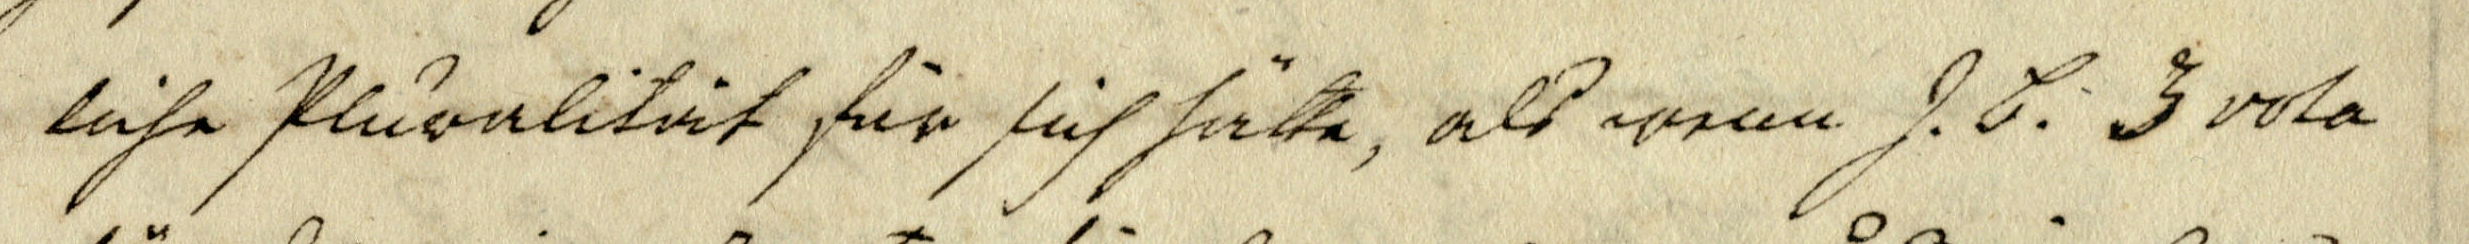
liche Pluralität für sich hätte, als wenn z. B. 3 vota
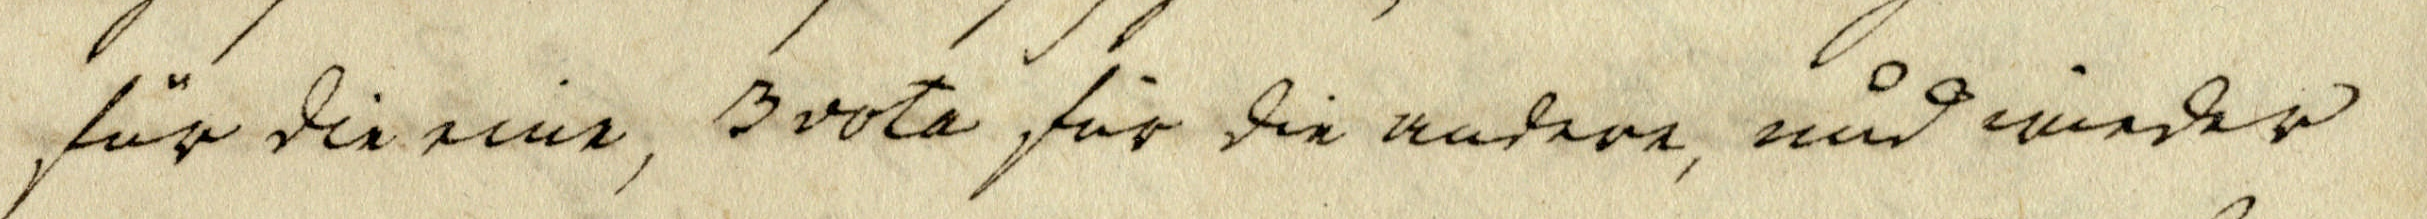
für die eine, 3 vota für die andere, und wieder
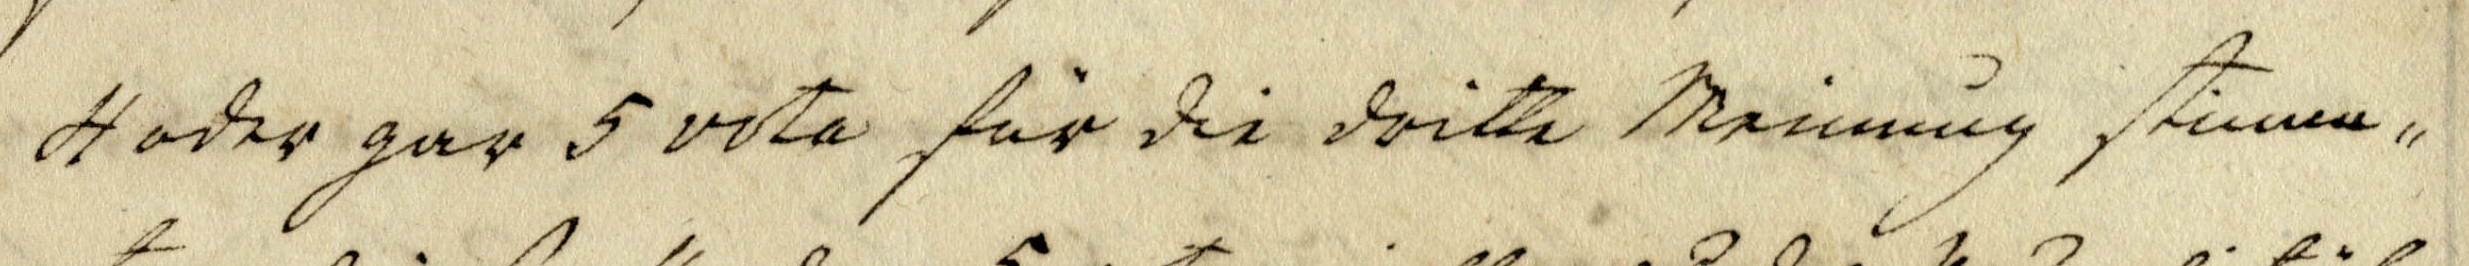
4 oder gar 5 vota für die dritte Meinung stimm¬
